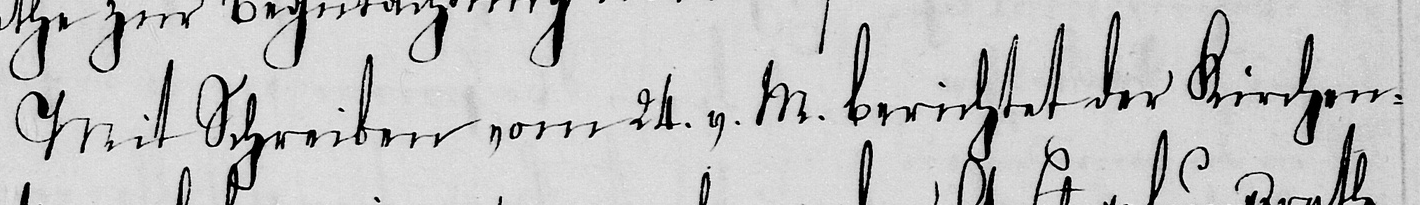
Mit Schreiben vom 24. v. M. berichtet der Kirchen¬
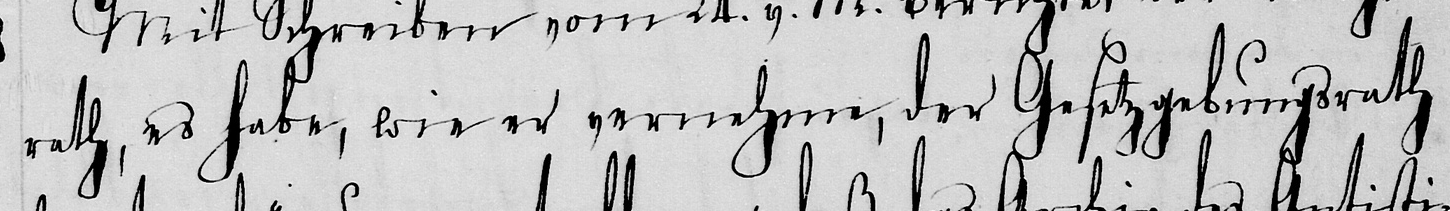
rath, es habe, wie er vernehme, der Gesetzgebungsrath
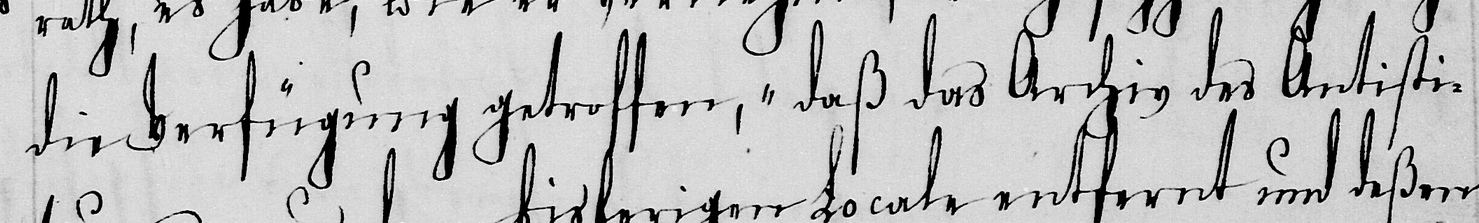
die Verfügung getroffen, „daß das Archiv des Antisti¬
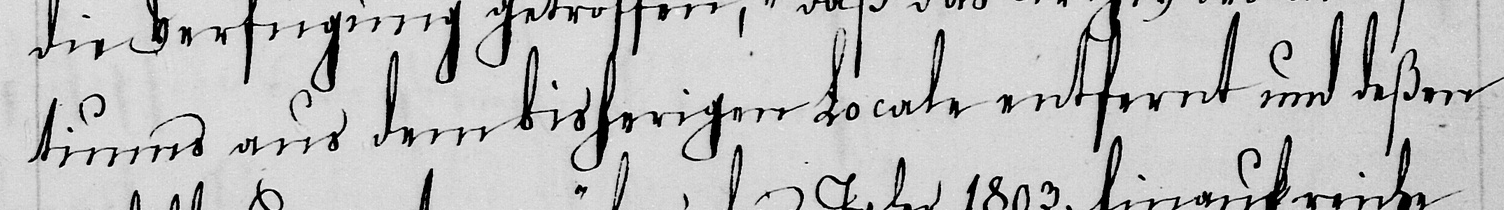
tiums aus dem bisherigen Locale entfernt und deßen
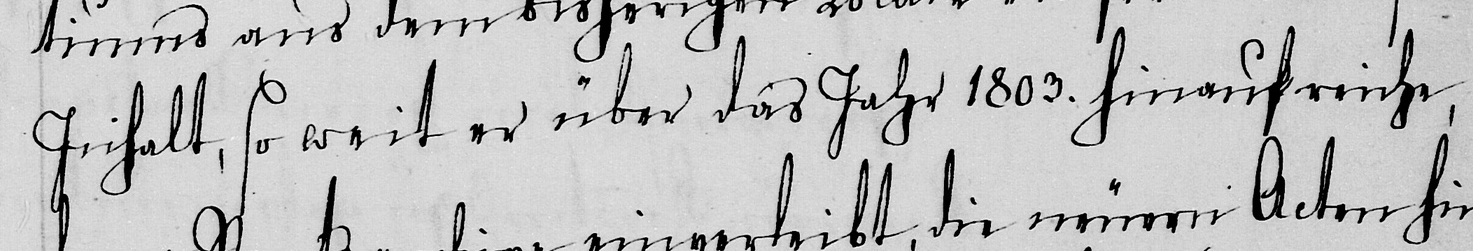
Inhalt, so weit er über das Jahr 1803. hinausreiche,
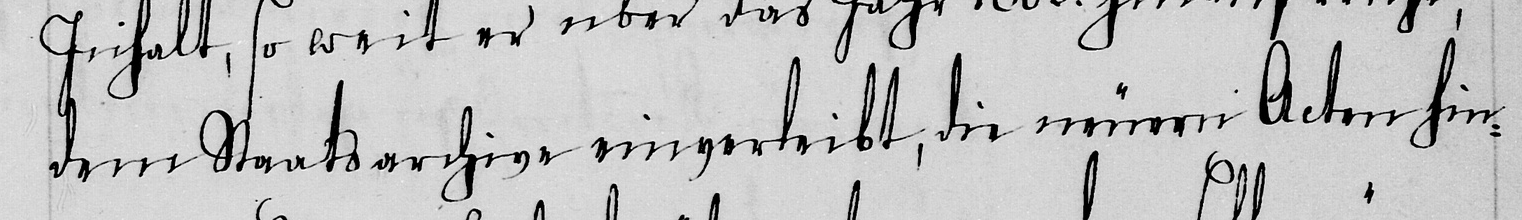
dem Staatsarchive einverleibt, die neuern Acten hin¬
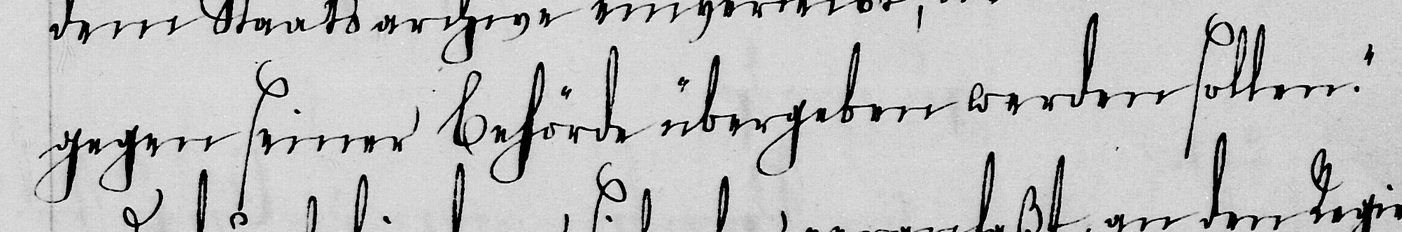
gegen seiner Behörde übergeben werden sollen.“
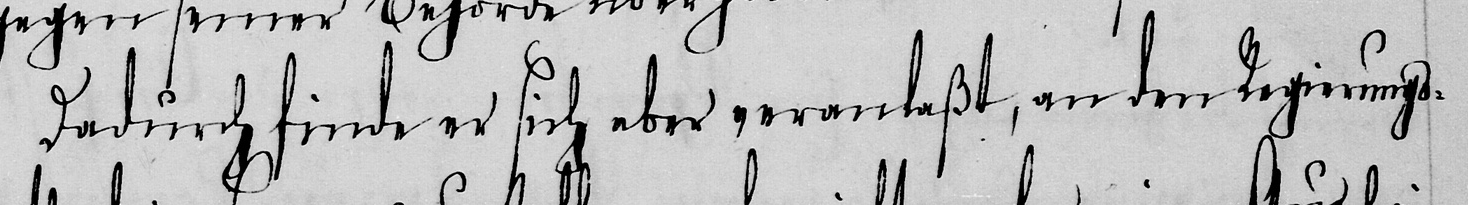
Dadurch finde er sich aber veranlaßt, an den Regierungs¬
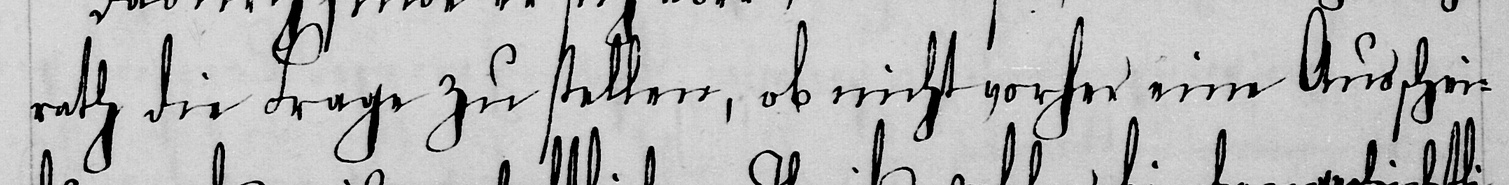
rath die Frage zu stellen, ob nicht vorher eine Ausschei¬
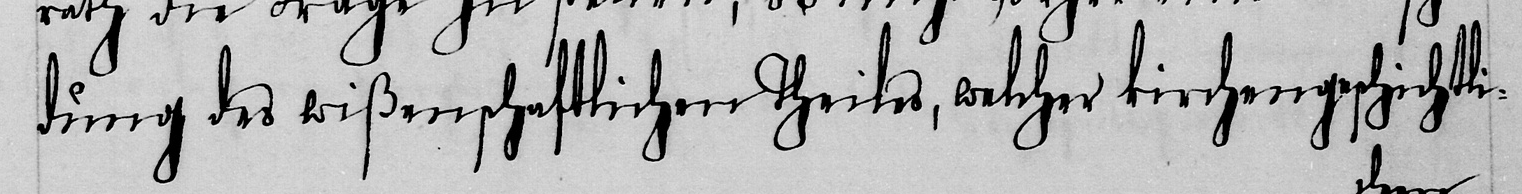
dung des wißenschaftlichen Theiles, welcher kirchengeschichtli-
